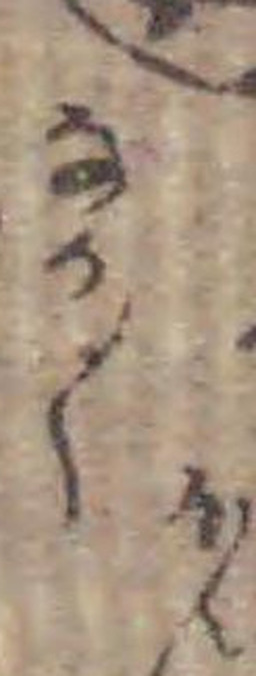なか〳〵
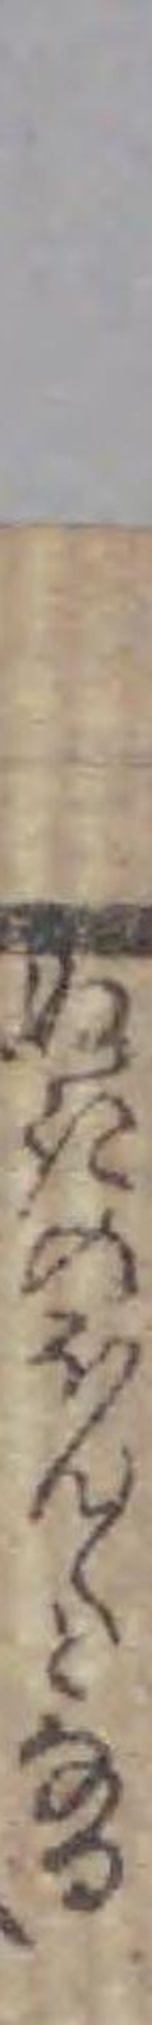ぬきのほん〳〵となる
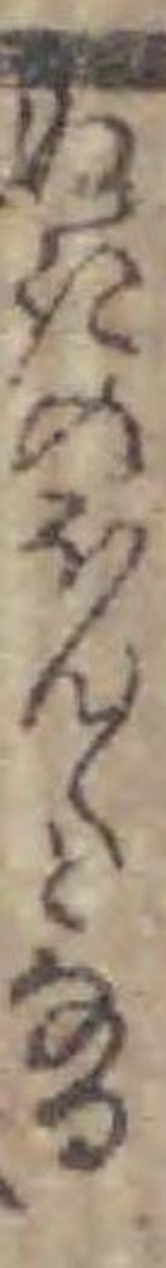ぬきのほん〳〵となる
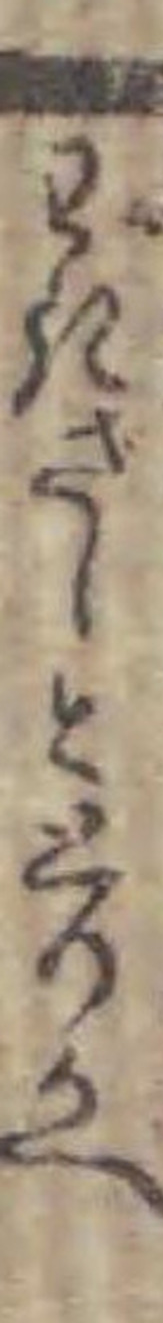わきざしととりかへ
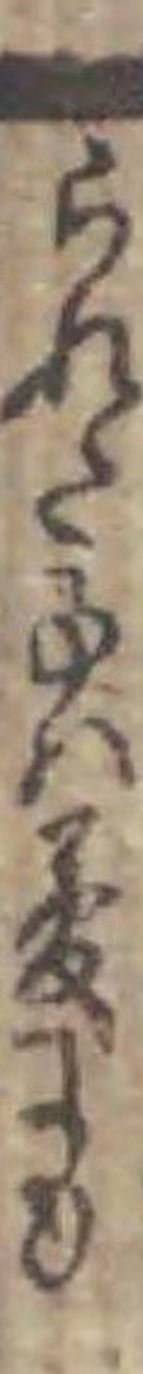られた事は夢にも
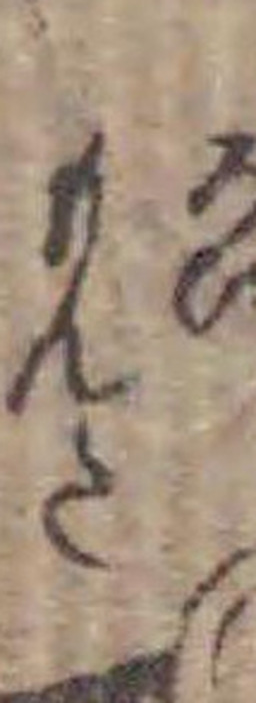もんた
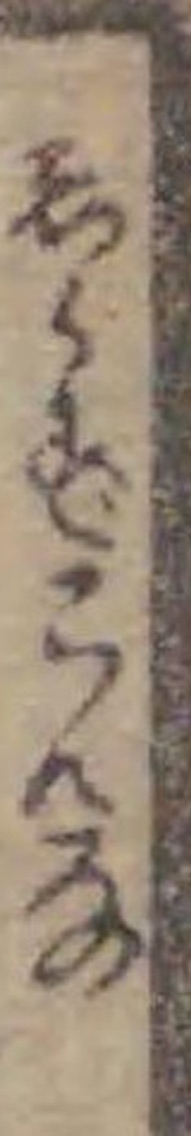しらずこんな
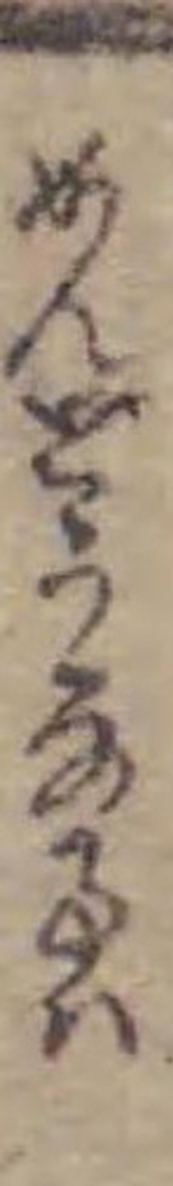めんどうな事は
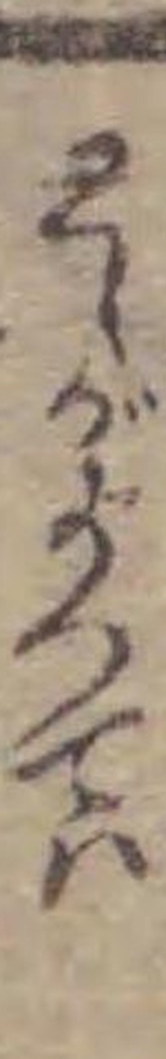としがよつては
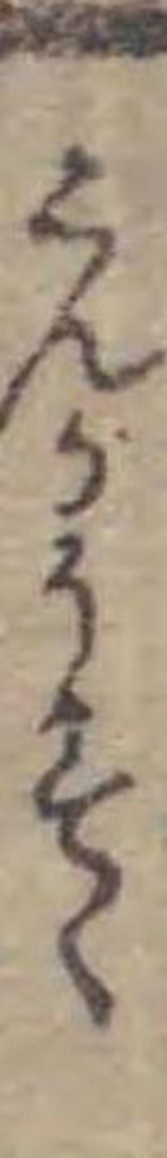こんがうすく
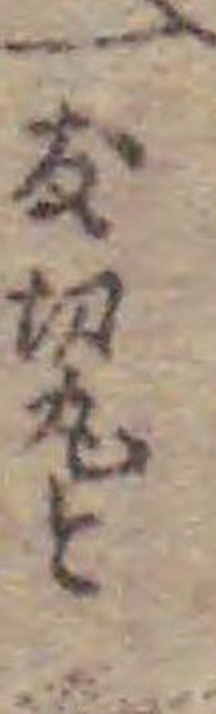友切丸と
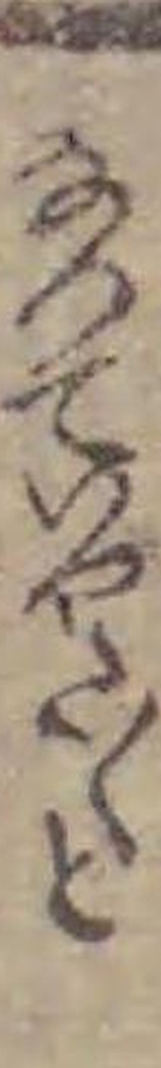なつていやた〳〵と
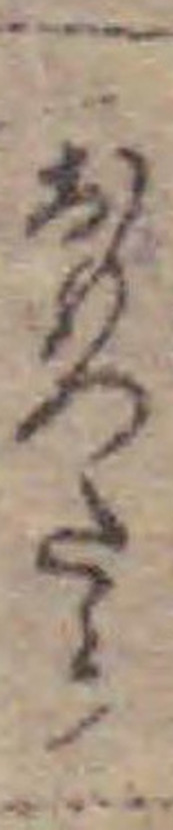おもつたら
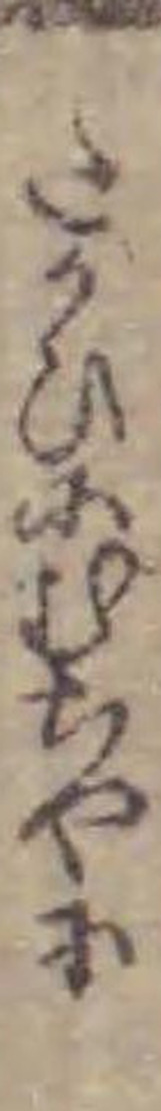たかひにむちやに
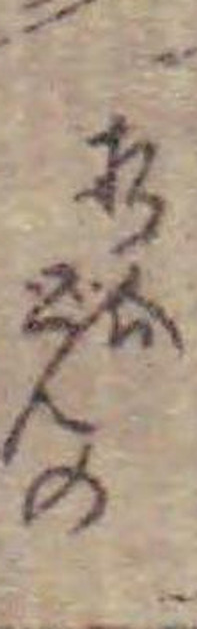どんの
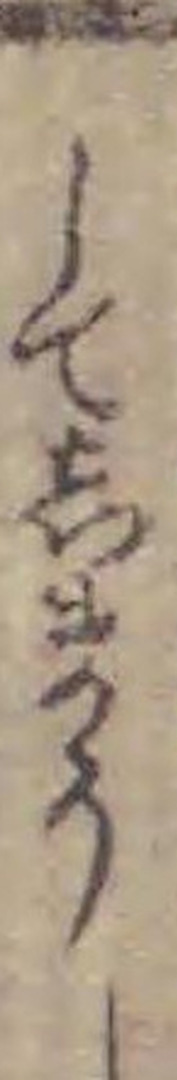してしまう
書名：年寄之冷水曽我 : 3巻
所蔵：国立国会図書館 National Diet Library, JAPAN
